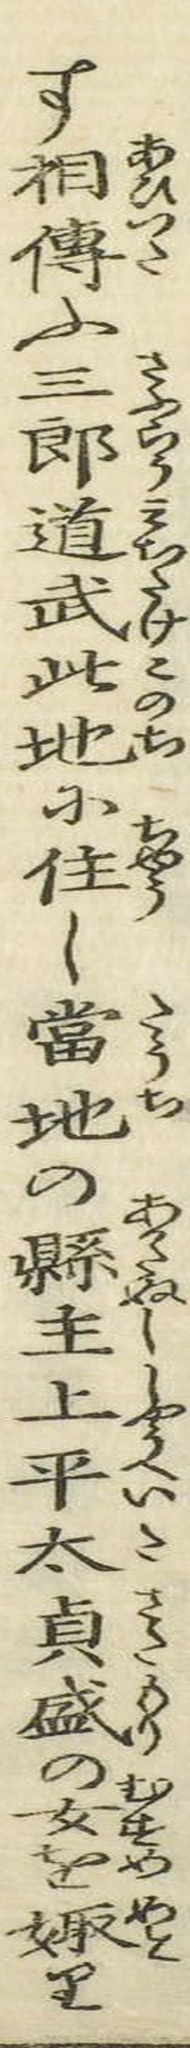す相伝ふ三郎道武此地に住し当地の県主上平太貞盛の女を娵り
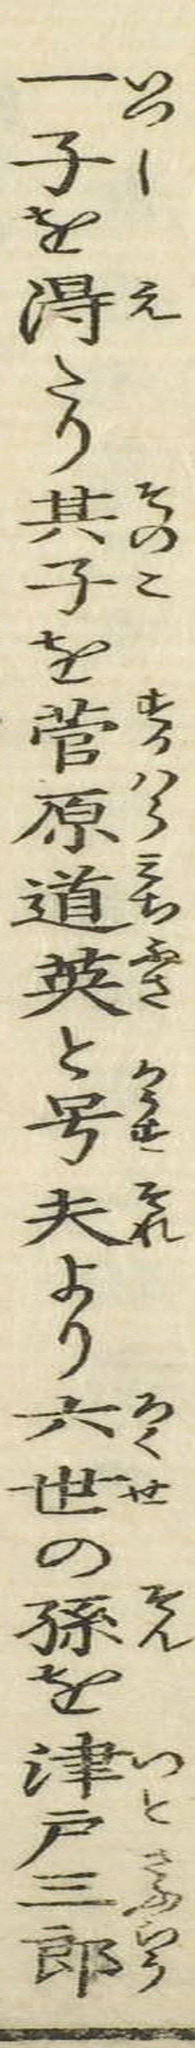一子を得たり其子を菅原道英と号夫より六世の孫を津戸三郎
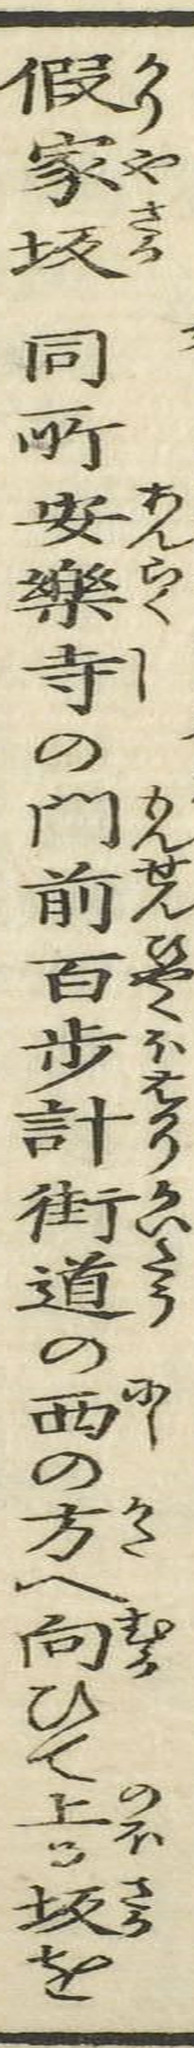仮屋坂同所安楽寺の門前百歩計街道の西の方へ向ひて上る坂を
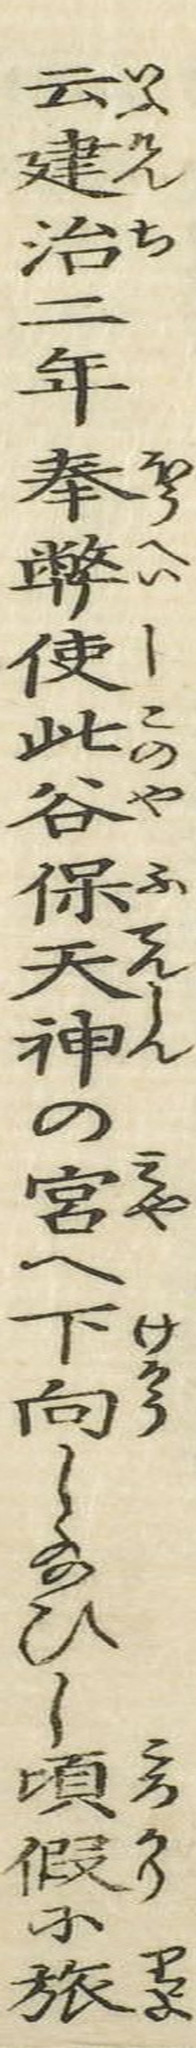云建治二年奉幣使此谷保天神の宮へ下向し給ひし頃仮に旅
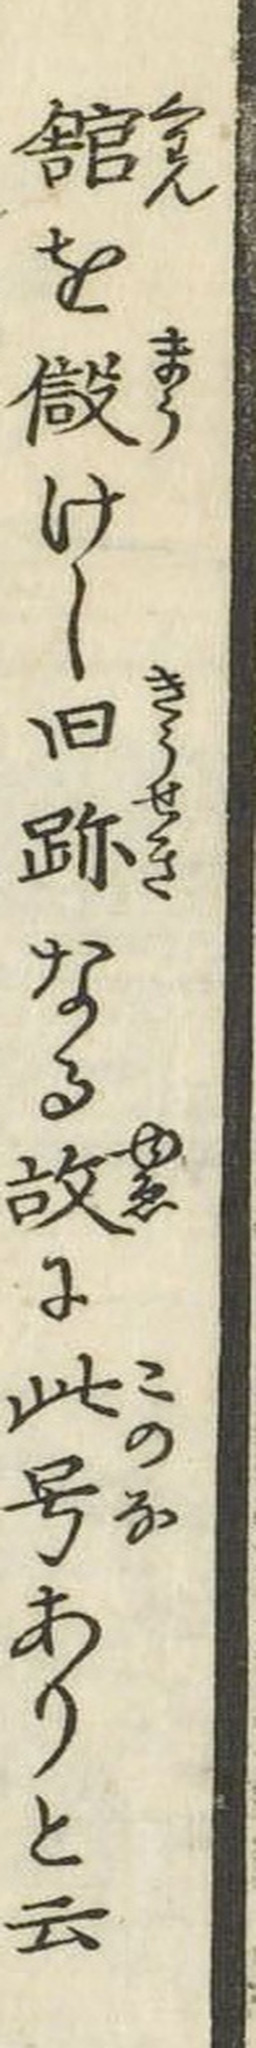館をけし旧跡なる故に此号ありと云
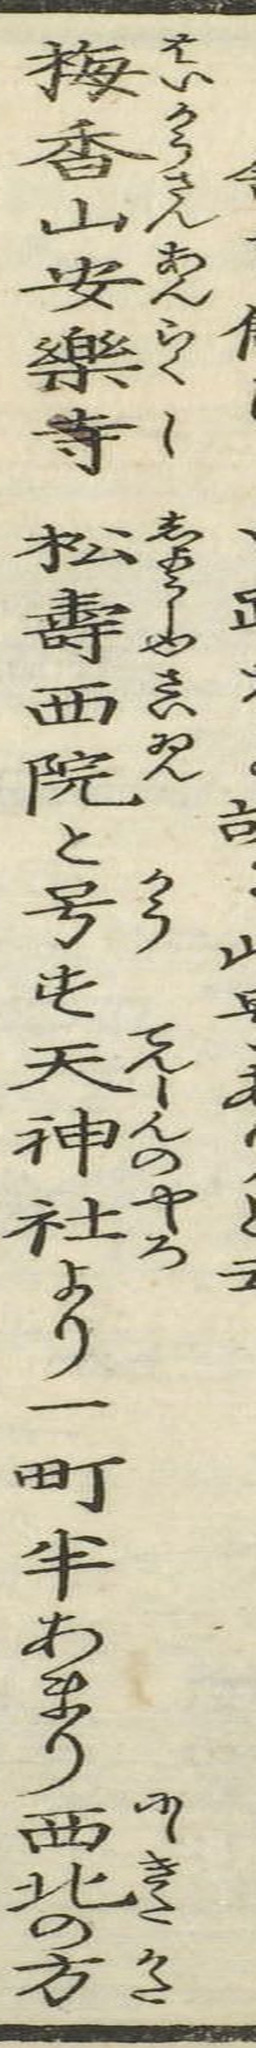梅香山安楽寺松寿西院と号す天神社より一町半あまり西北の方
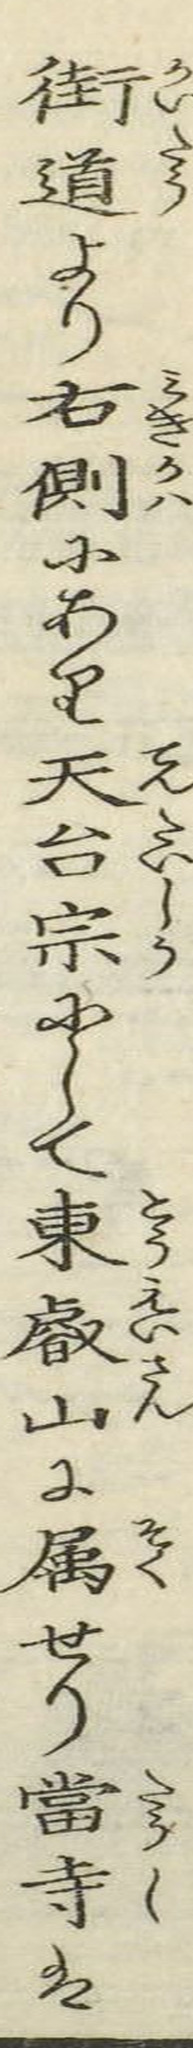街道より右側にあり天台宗にして東叡山に属せり当寺は
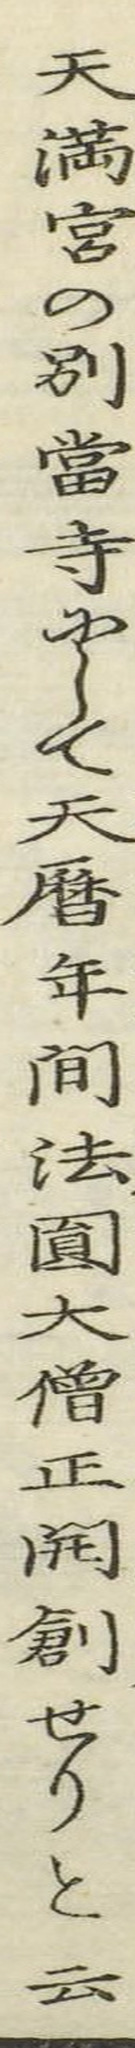天満宮の別當寺にして天暦年間法円大僧正開創せりと云
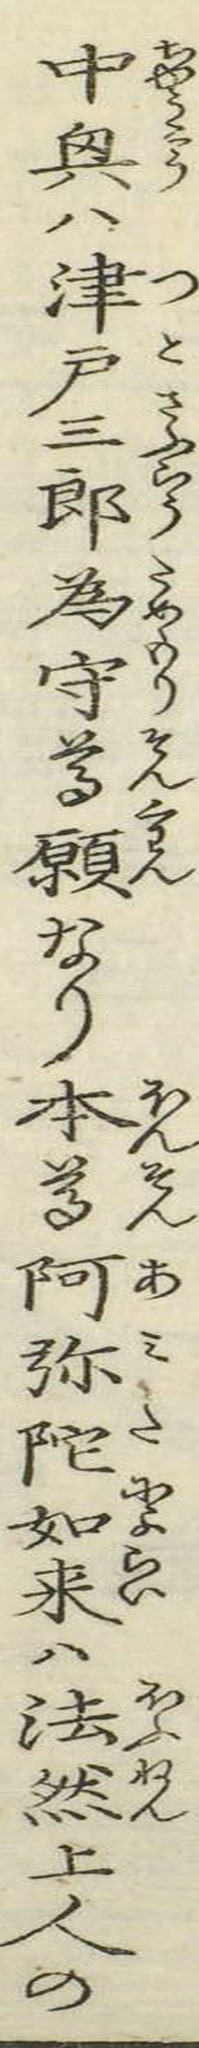中興は津戸三郎為守尊願なり本尊阿弥陀如来は法然上人の
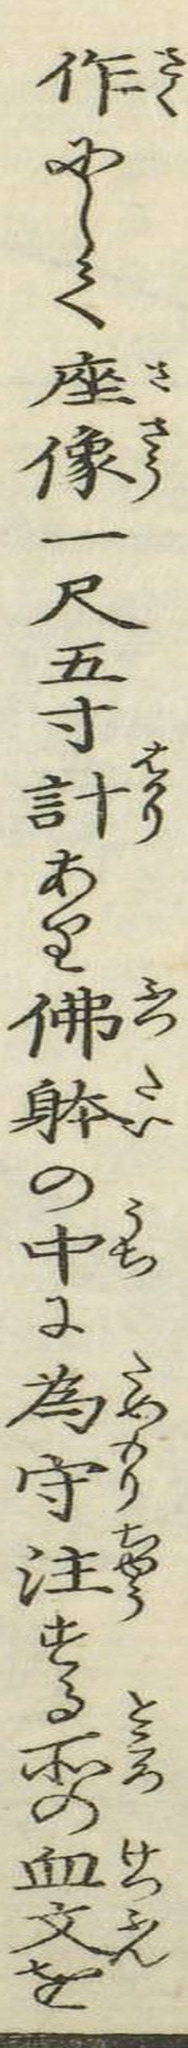作にして座像一尺五寸計あり仏躰の中に為守注する所の血文を
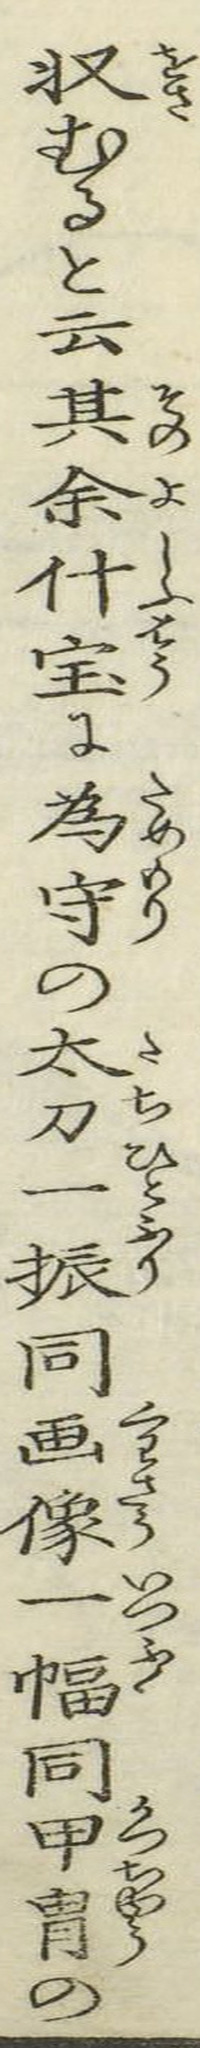収むると云其余什宝に為守の太刀一振同画像一幅同甲冑の
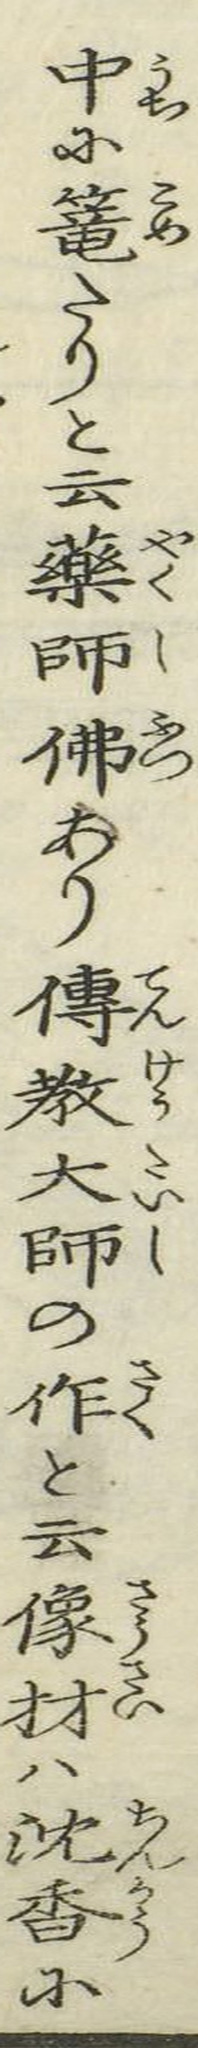中に篭たりと云薬師佛あり傳教大師の作と云像材は沈香に
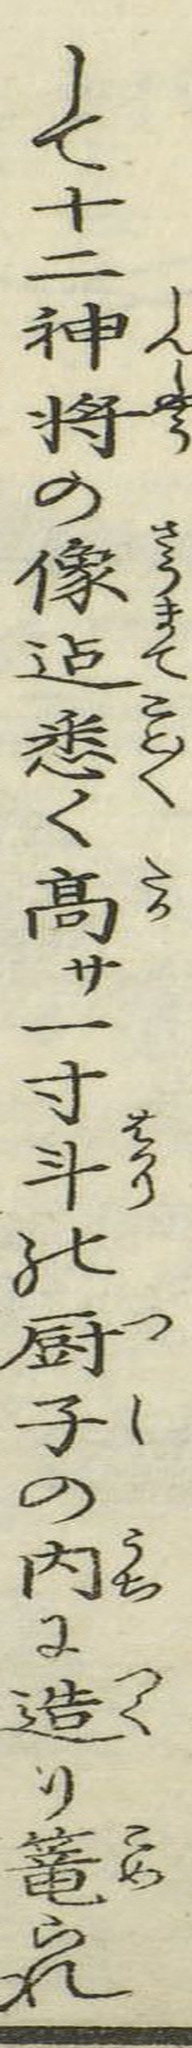して十二神将の像迠悉く高サ一寸斗の厨子の内に造り篭られ

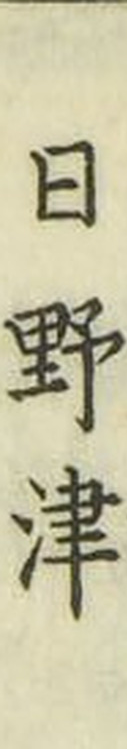日野津
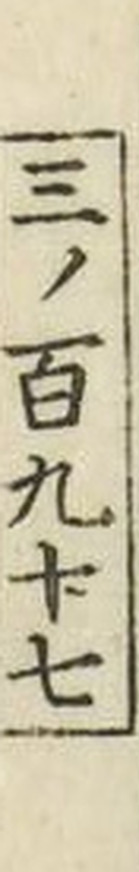三ノ百九十七
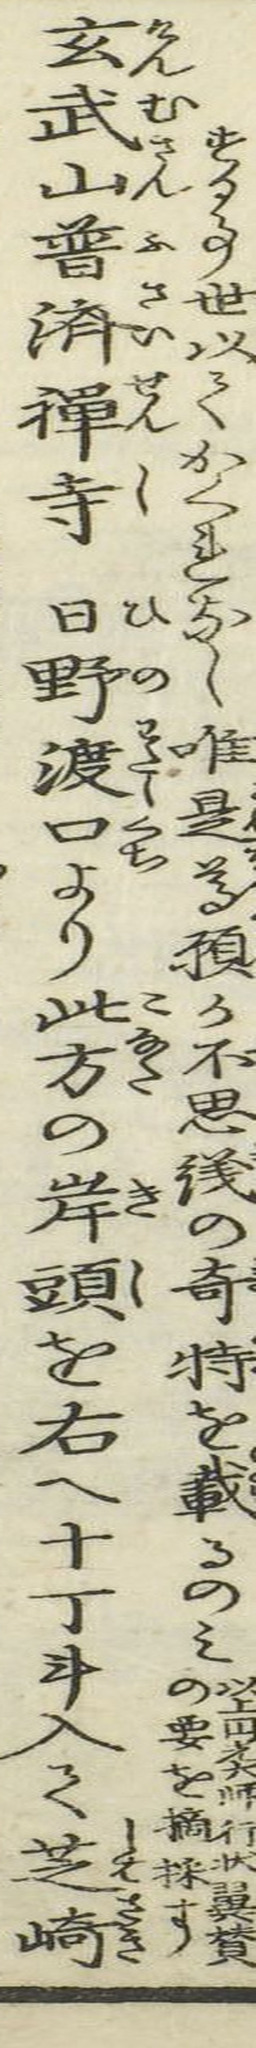玄武山普済禅寺日野渡口より此方の岸頭を右へ十丁斗入て芝崎
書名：江戸名所図会 20巻 巻之10
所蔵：東京学芸大学教育コンテンツアーカイブ
